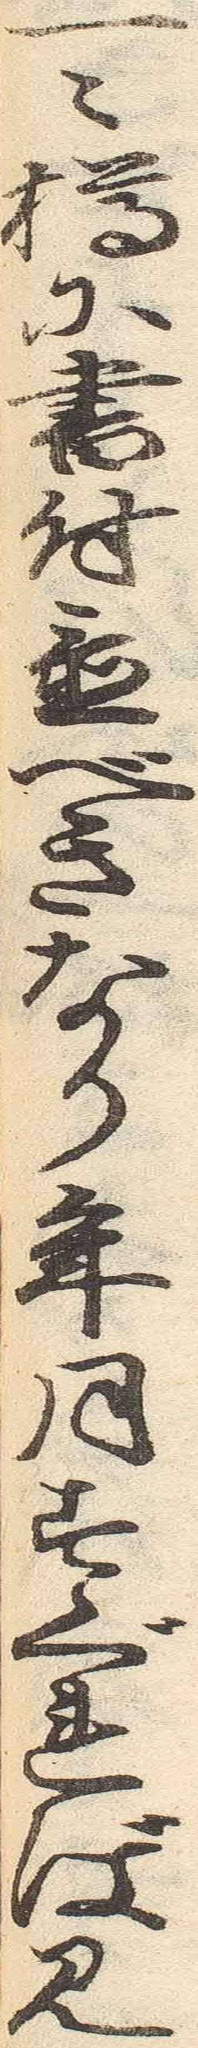一々樽に書付置べきなり年月すぐれば見
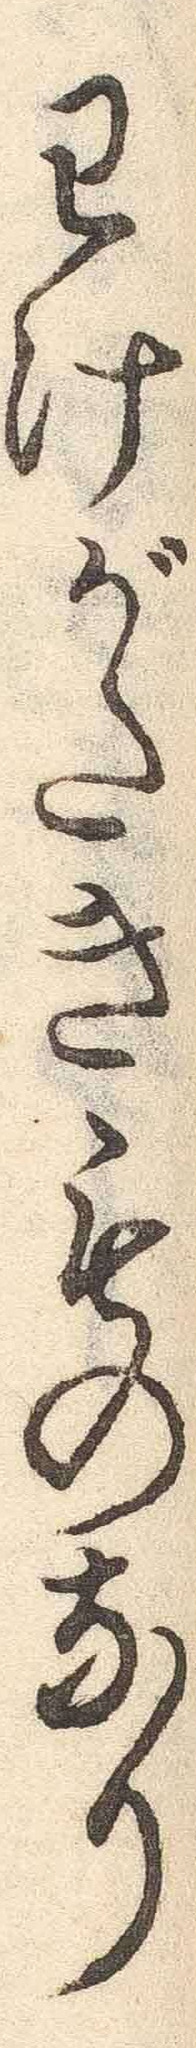わけがたきものなり
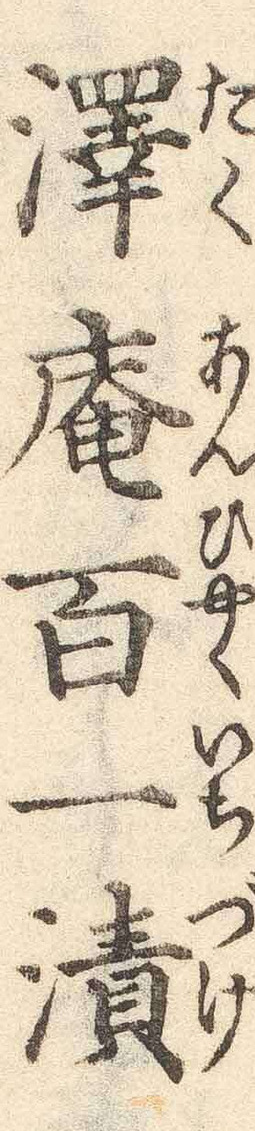沢庵百一漬
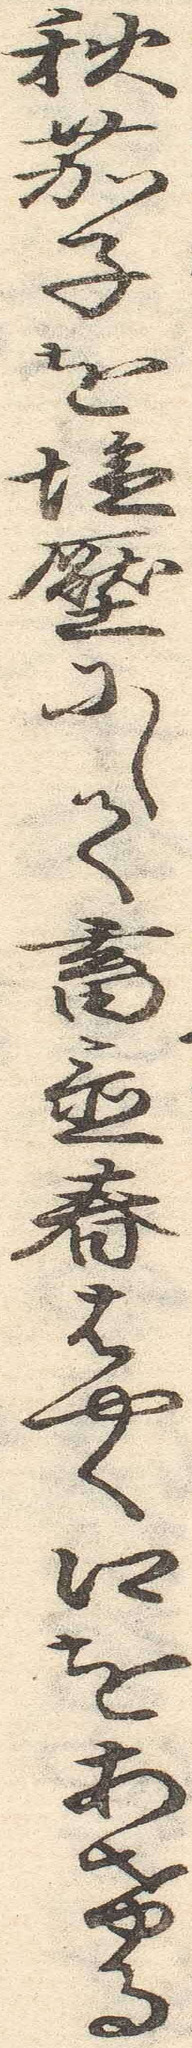秋茄子を塩圧にして蓄置春はやく口をあける
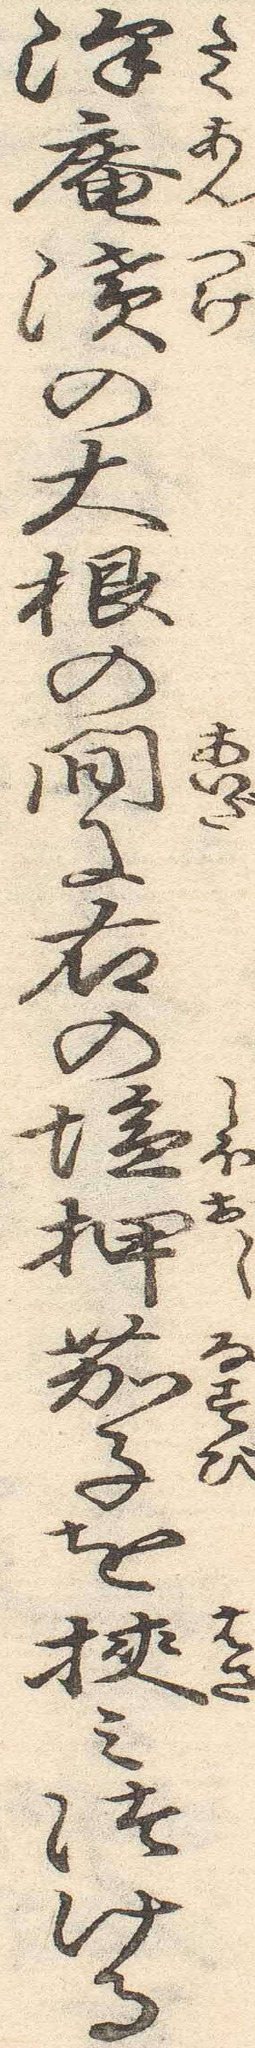沢庵漬の大根の間に右の塩押茄子を挟みつける
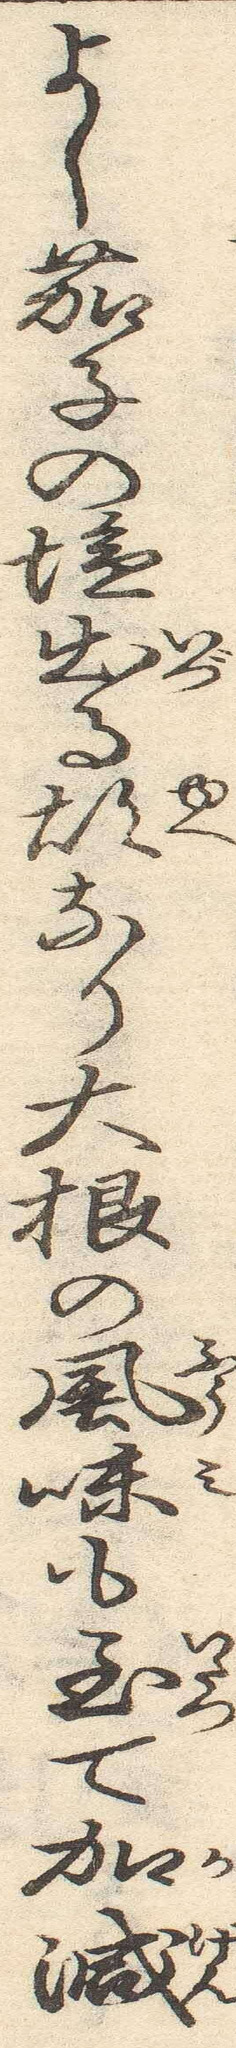よし茄子の塩出る故なり大根の風味も至て加減
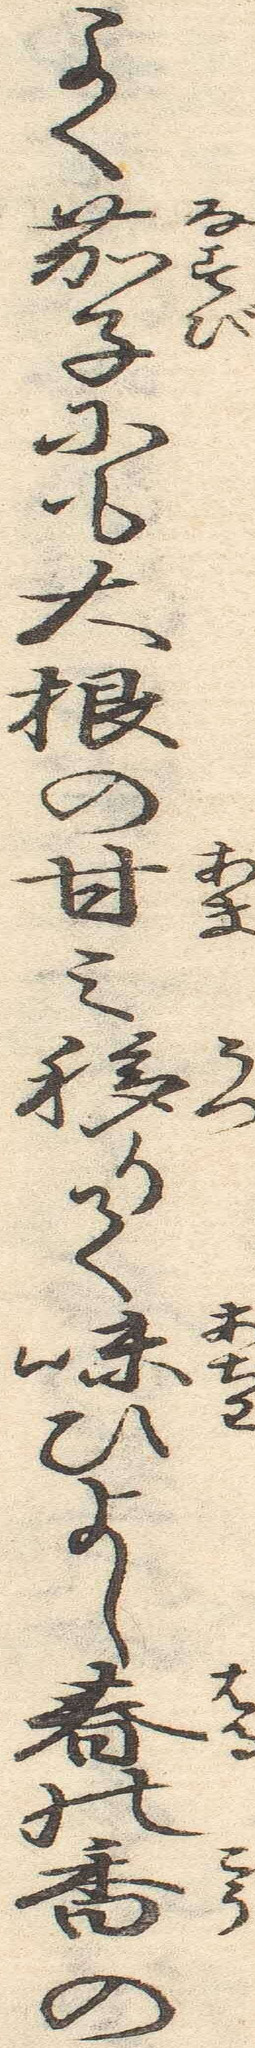よく茄子にも大根の甘み移りて味ひよし春の香の
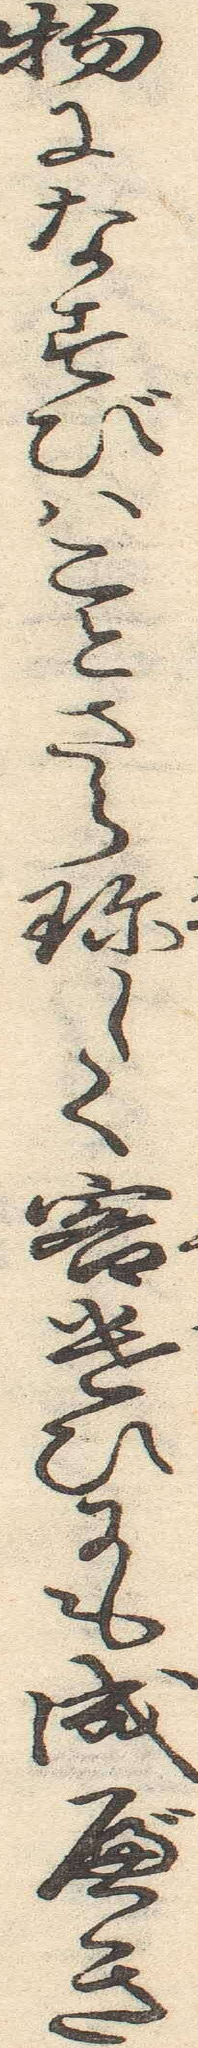物になすびはことさら珍しく客遣ひにも成べき
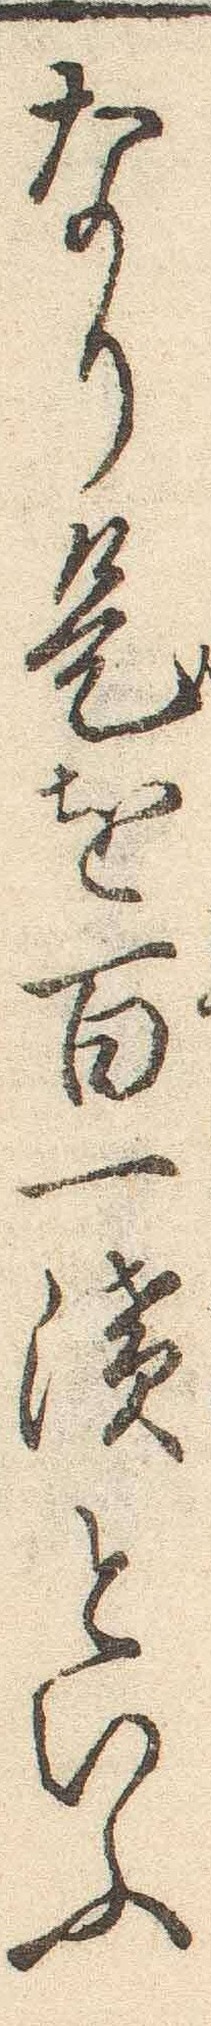なり是を百一漬といふ

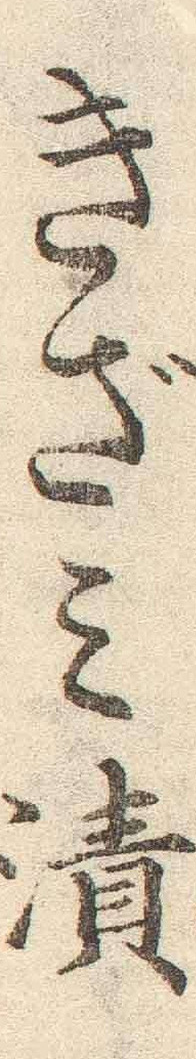きざみ漬
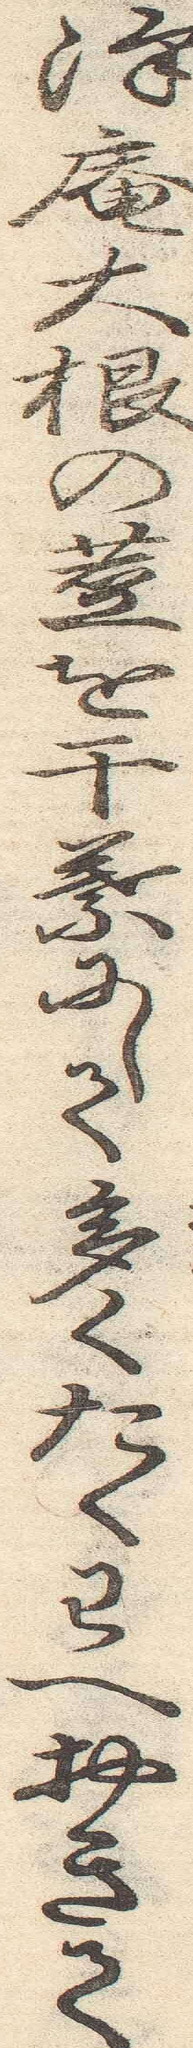澤庵大根の茎を干葉にして多くたくわへおきて
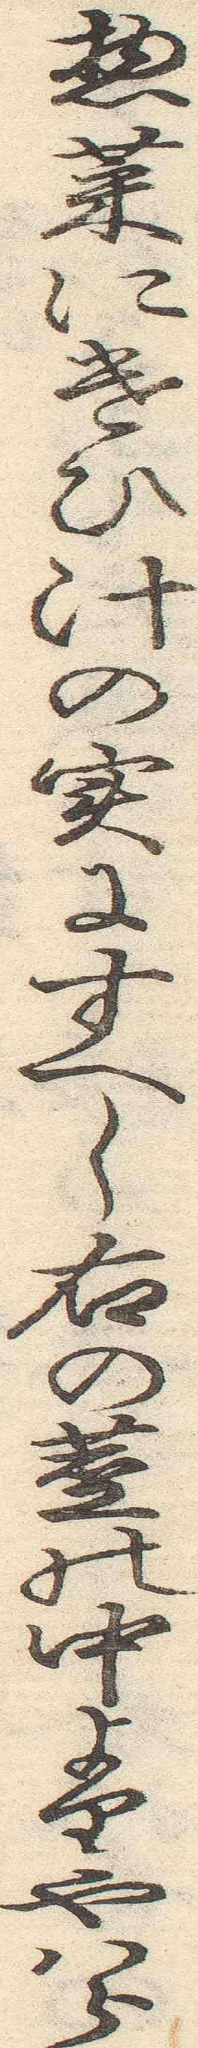惣菜に遣ひ汁の実にすへし右の茎の中よりやはら
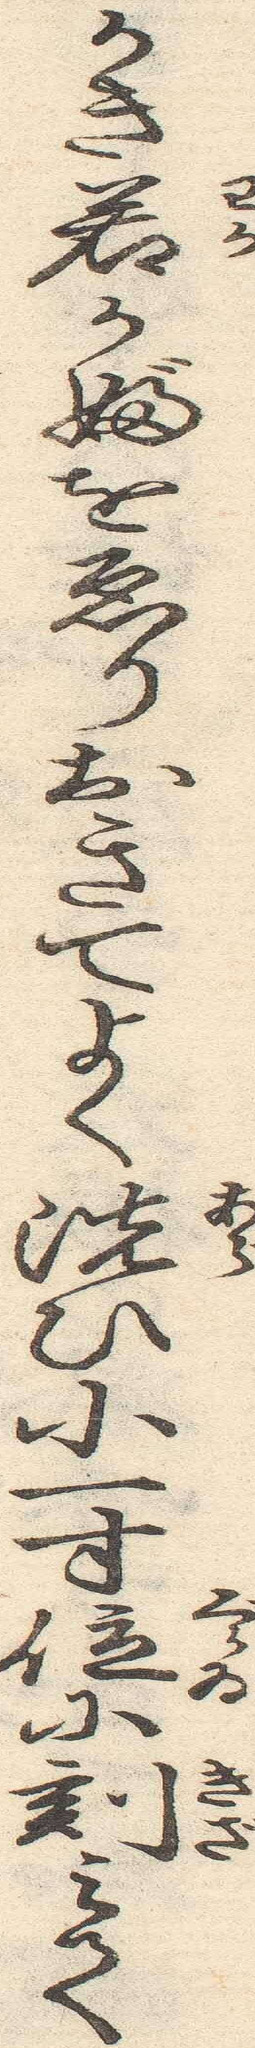かき若かぶをゑりおきてよく洗ひ小一寸位に刻みて
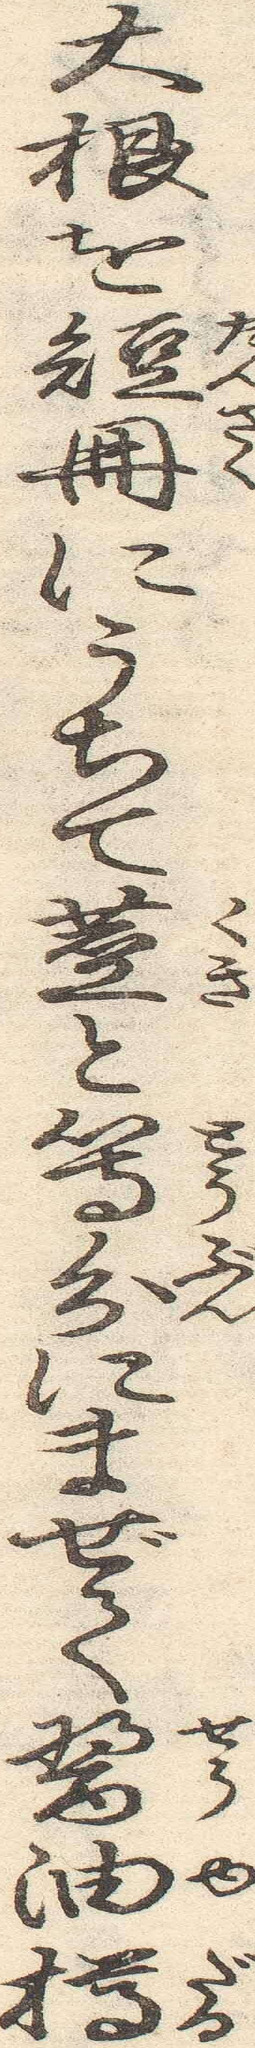大根を短冊にうちて茎と等分にまぜて醤油樽
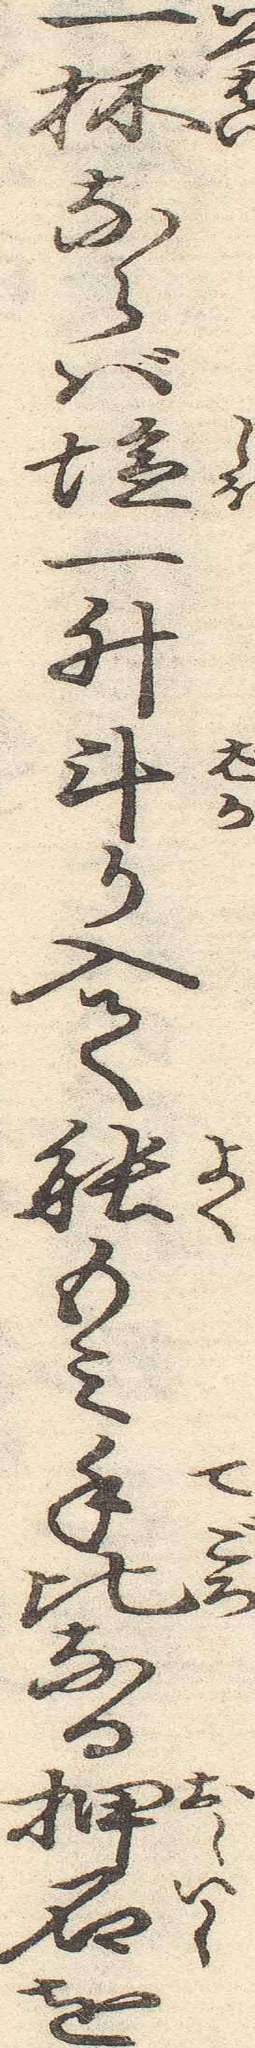一杯ならば塩一升斗り入て能もみ手比なる押石を
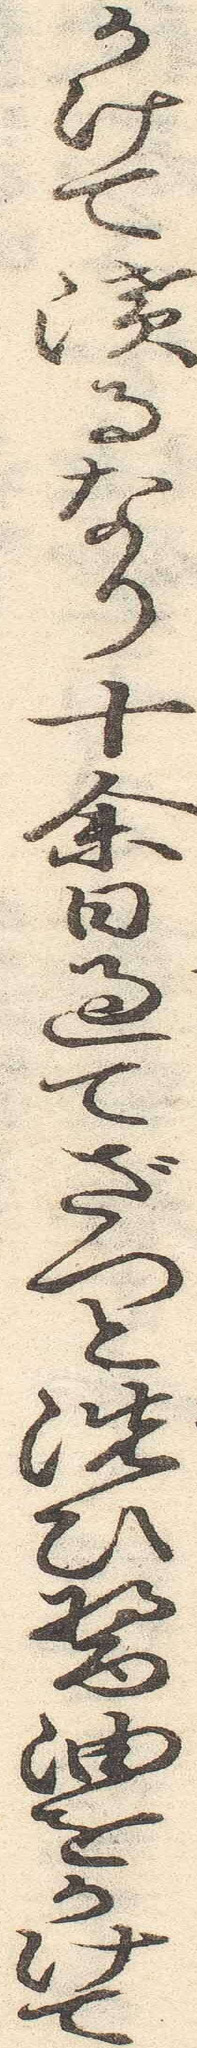かけて漬るなり十余日過てざつと洗ひ醤油をかけて
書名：四季漬物塩嘉言
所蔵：東京学芸大学附属図書館 国文学研究資料館
